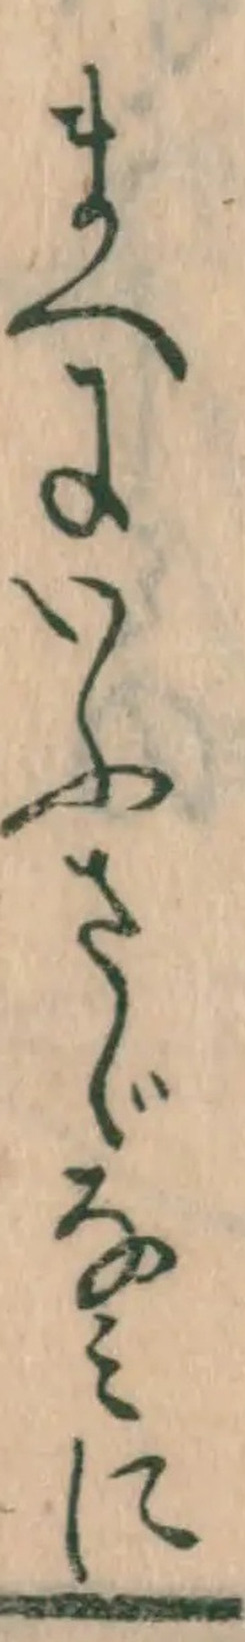まへにいふさゞなみに
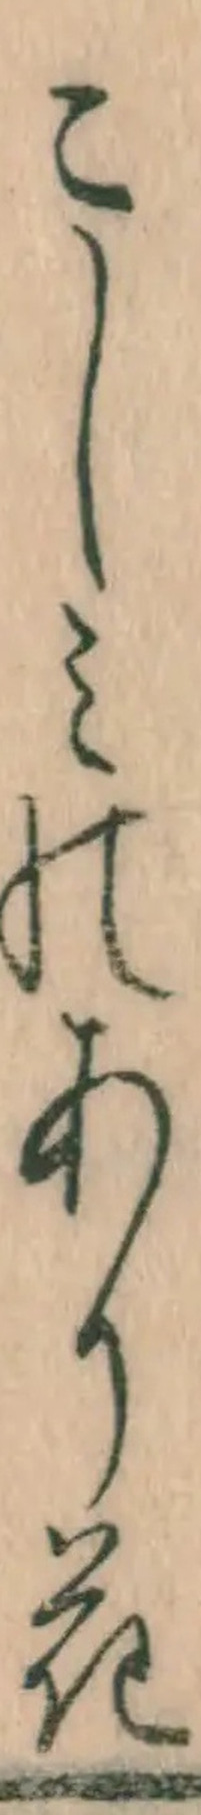こしみのあり花
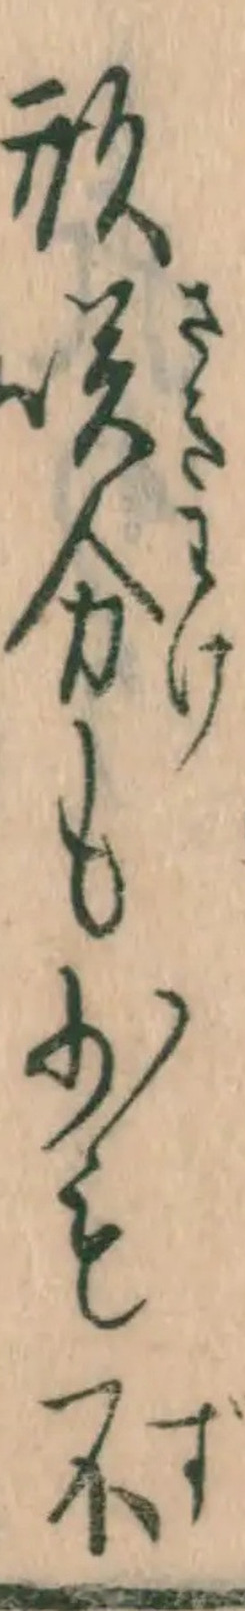形咲分も少も不
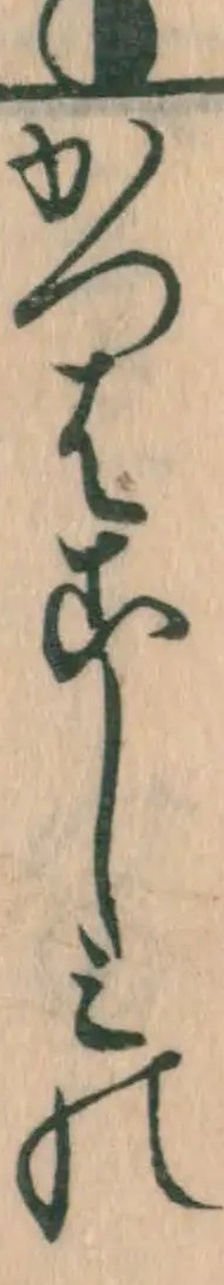かつはこしみの
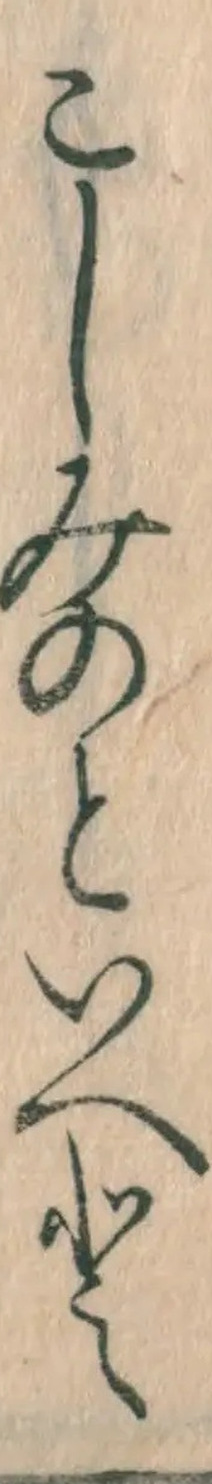こしみのといへと
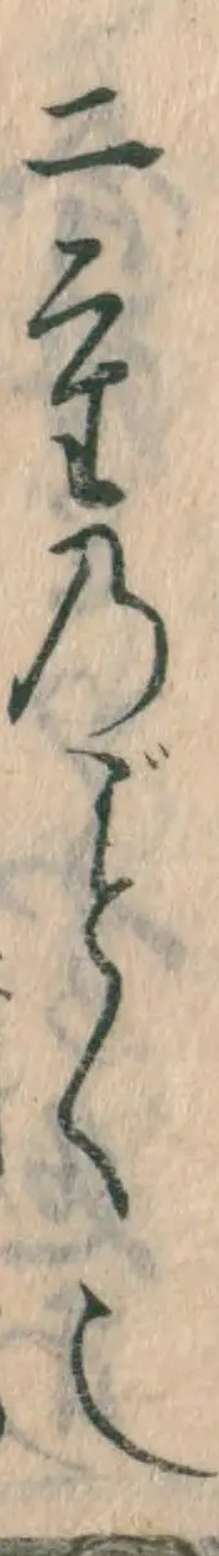二重のごとく也
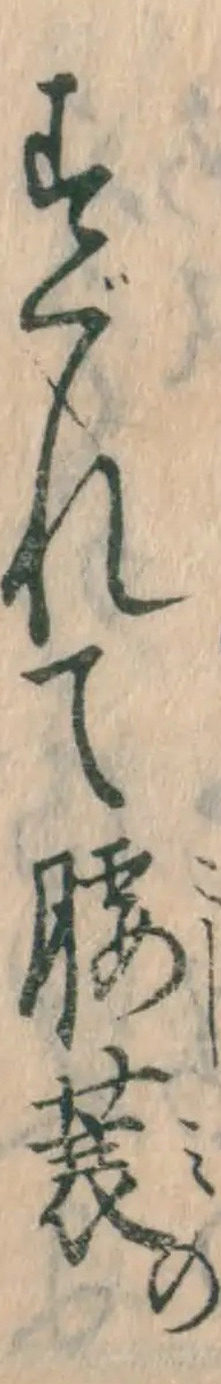すぐれて腰蓑

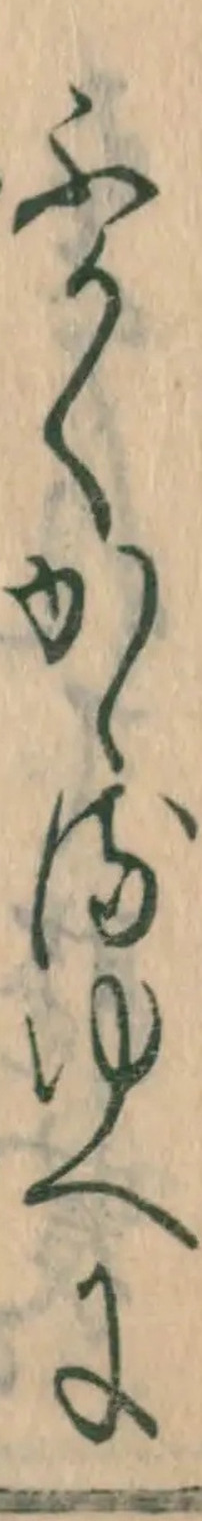ふかくかゝるゆへに
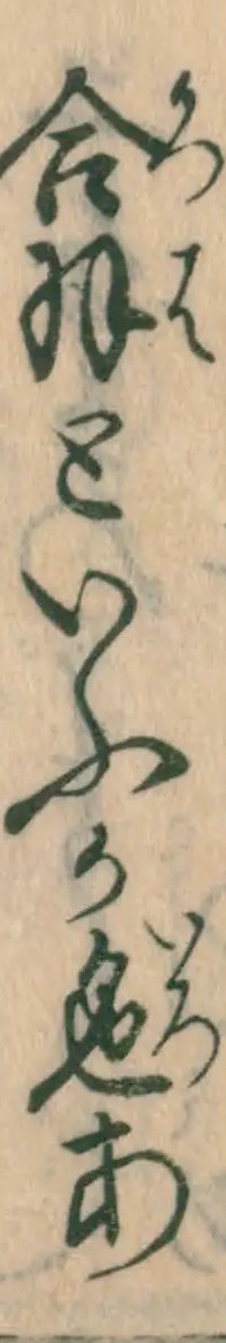合羽といふか色あ
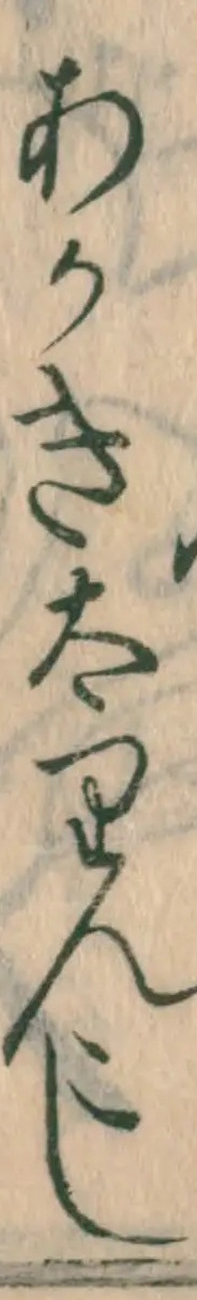あかき太りんこし
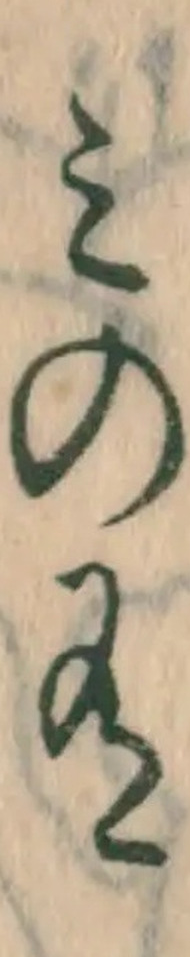みの有
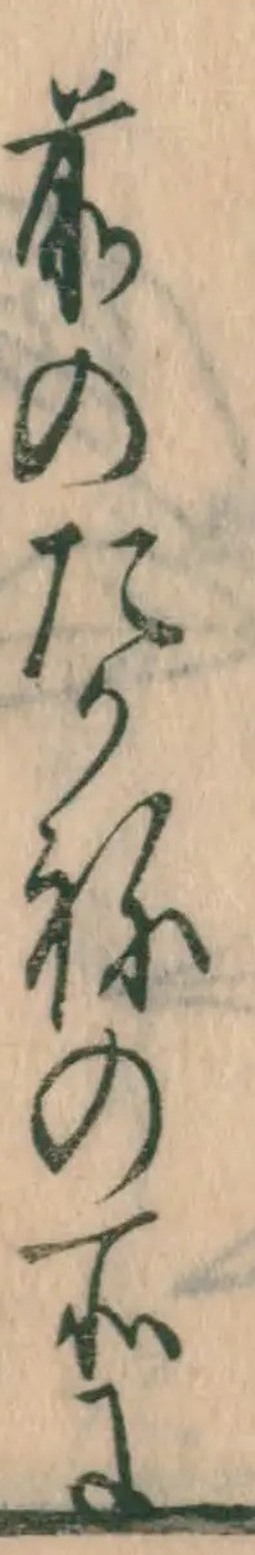前のたかねの所に
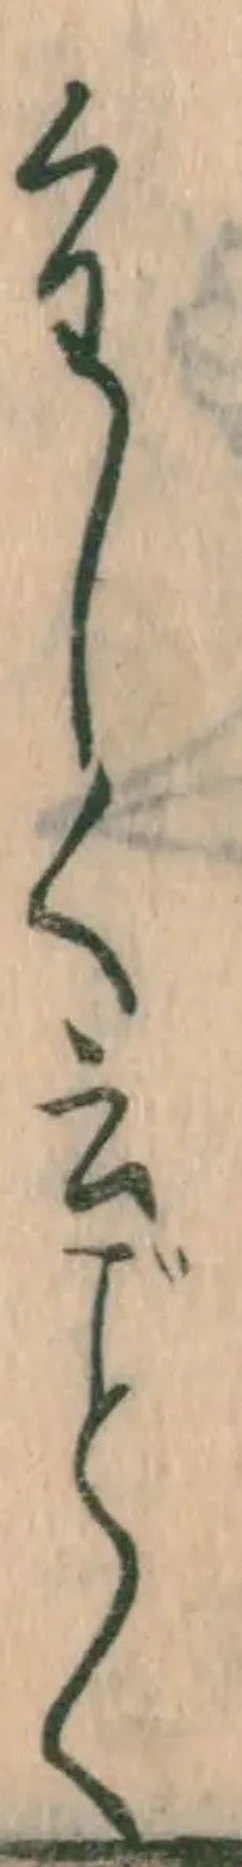くわしく云ごとく
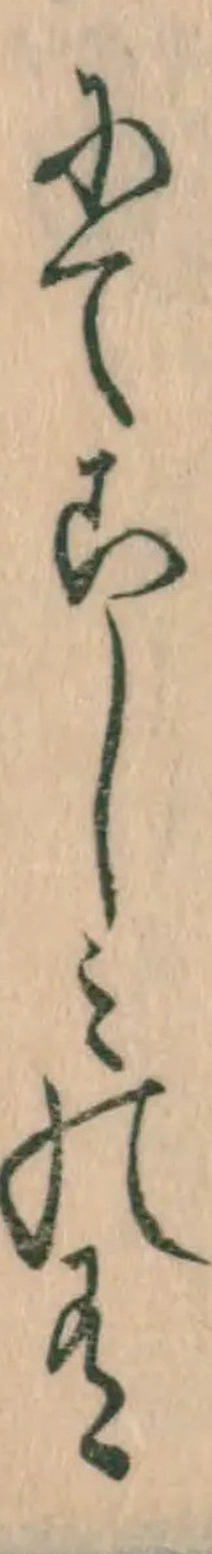にてこしみの有
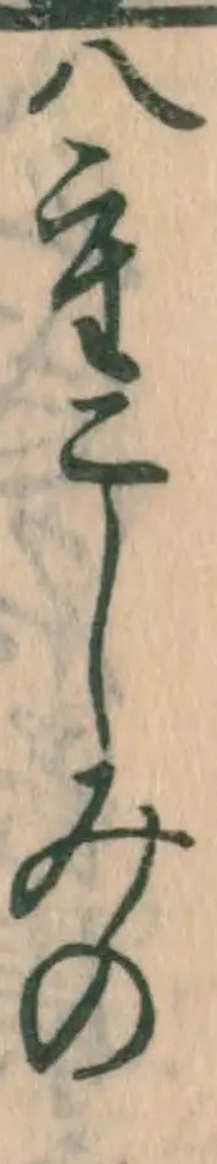●八重こしみの
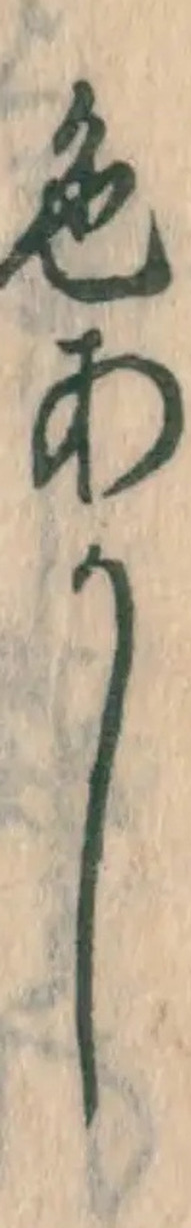色あかし
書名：錦繍枕 5巻. [5]
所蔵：国立国会図書館 National Diet Library, JAPAN
